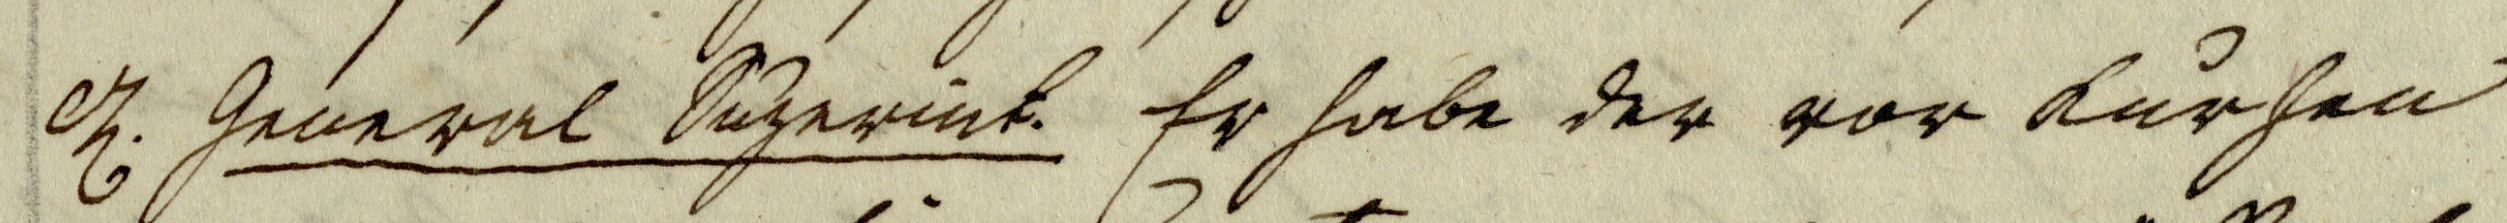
dh. General Superint. Er habe der vor kurzen
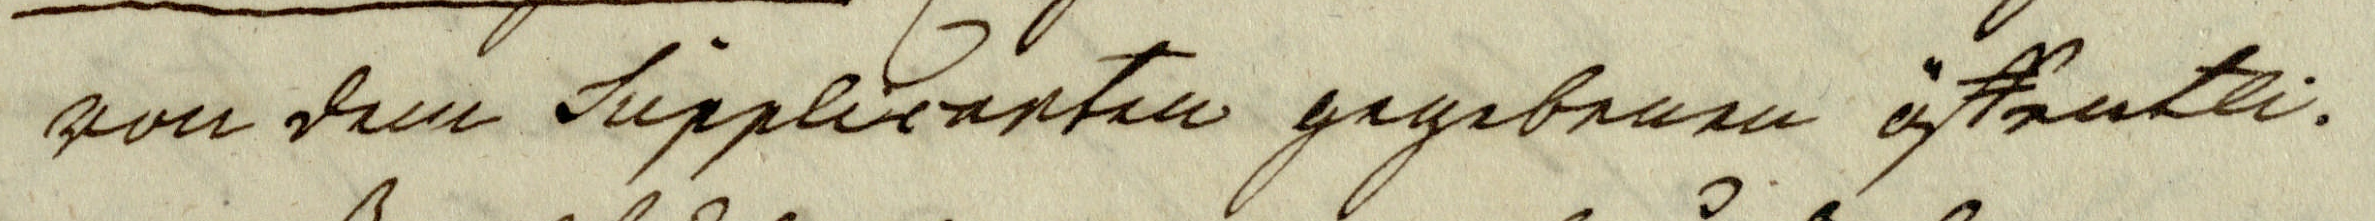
von dem Supplicanten gegebenen öffentli¬
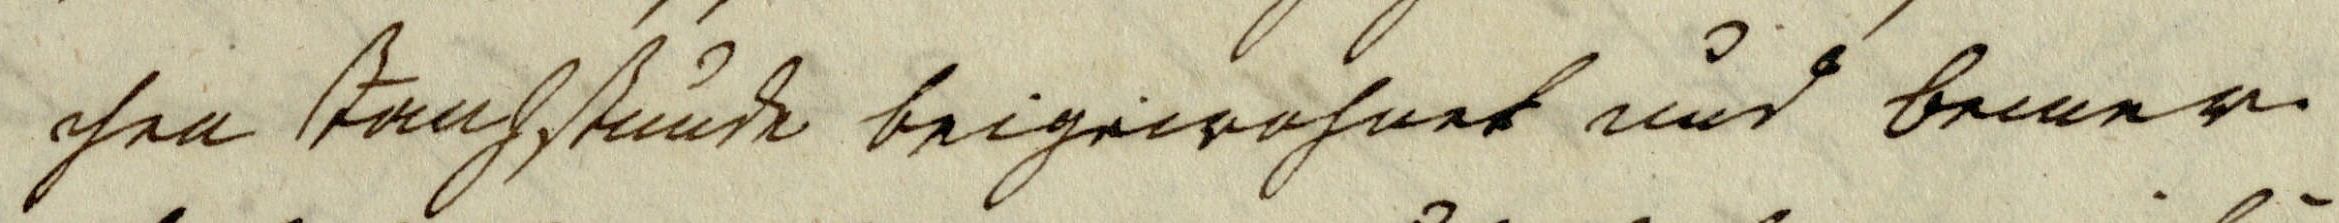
chen Tanzstunde beigewohnet und bemer¬
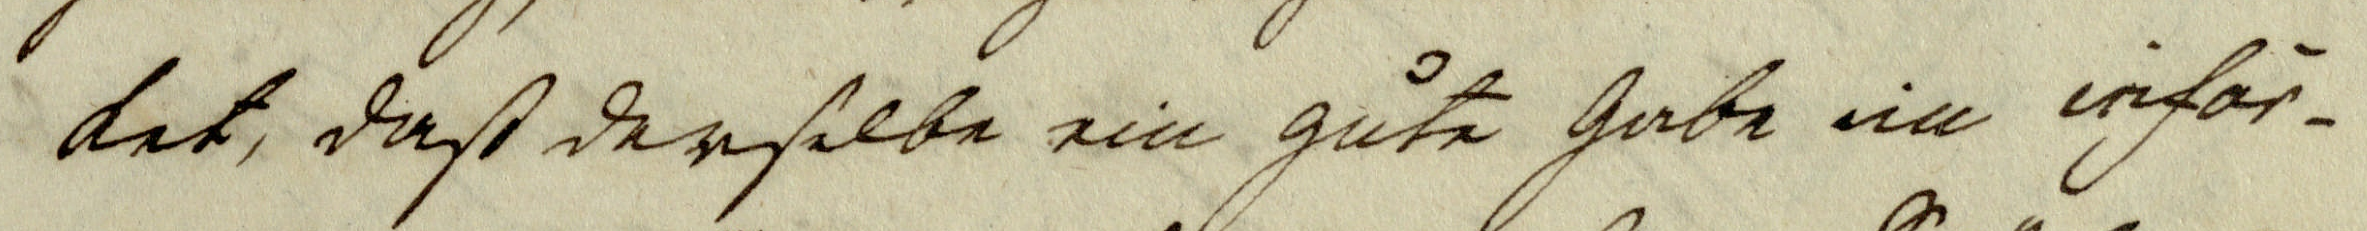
ket, daß derselbe ein gute Gabe im infor¬
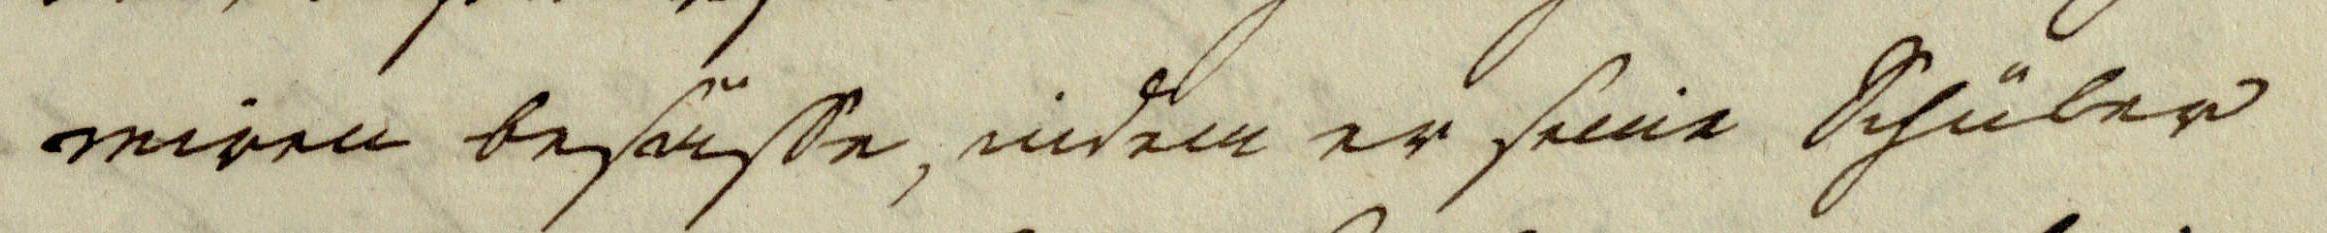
miren besässe, indem er seine Schüler
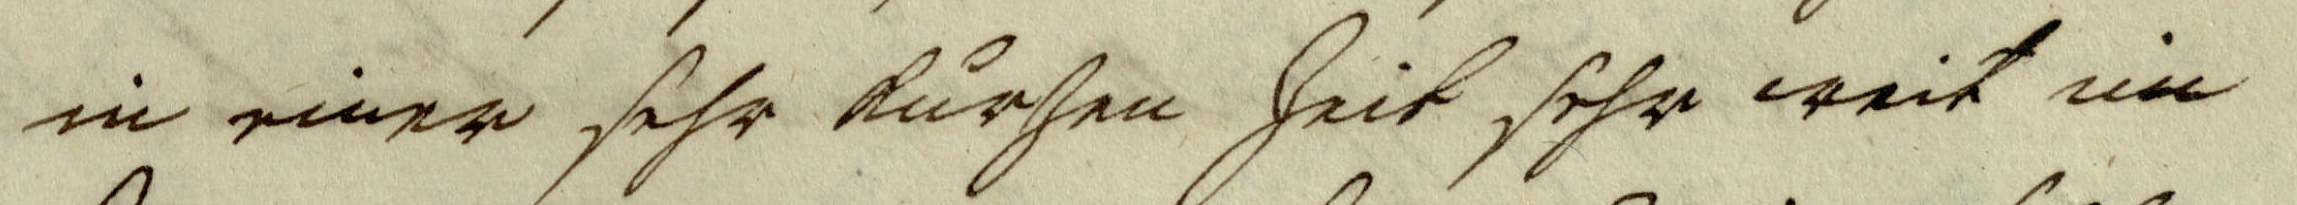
in einer sehr kurzen Zeit sehr weit im
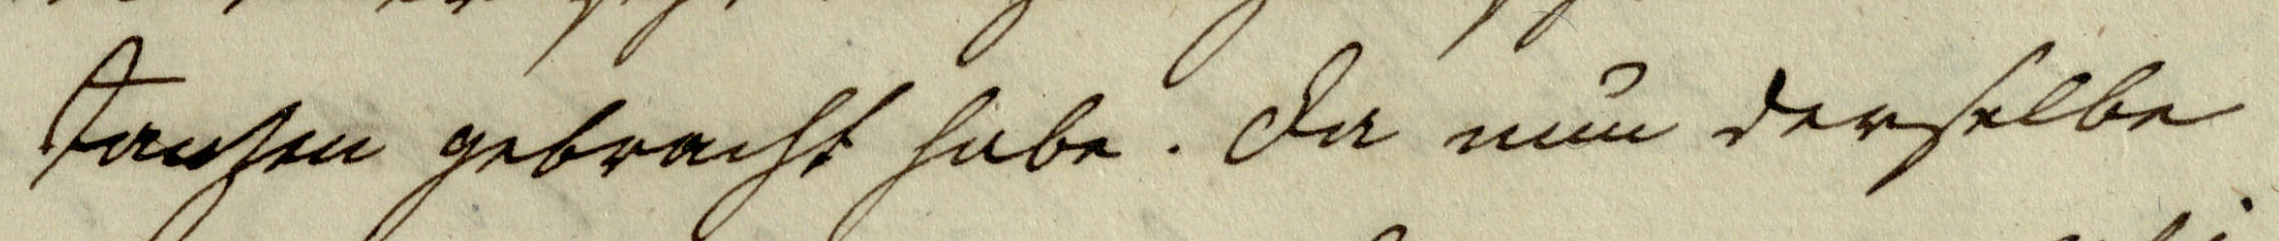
Tanzen gebracht habe. Da nun derselbe
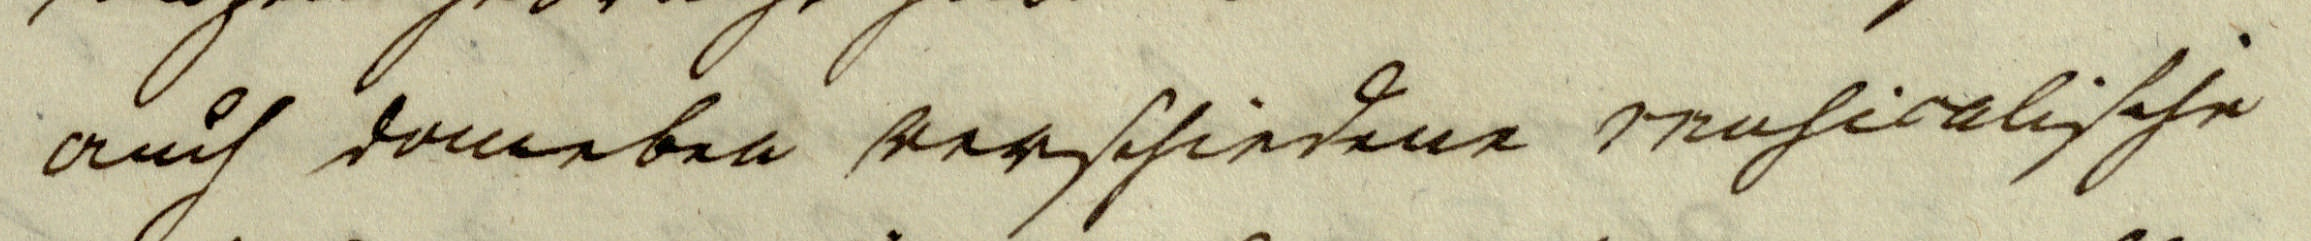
auch daneben verschiedene musicalische
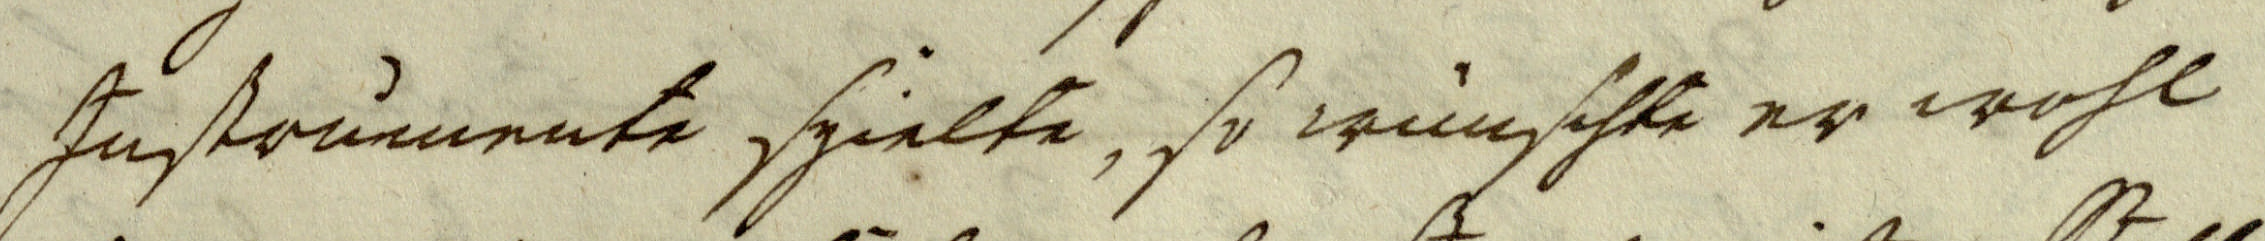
Instrumente spielte, so wünschte er wohl
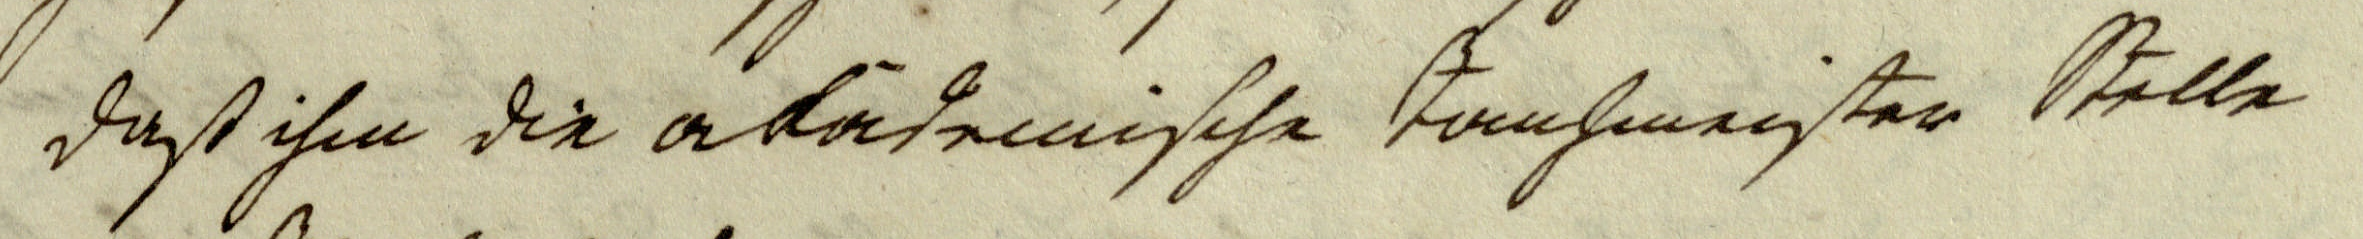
daß ihm die akademische Tanzmeister Stelle
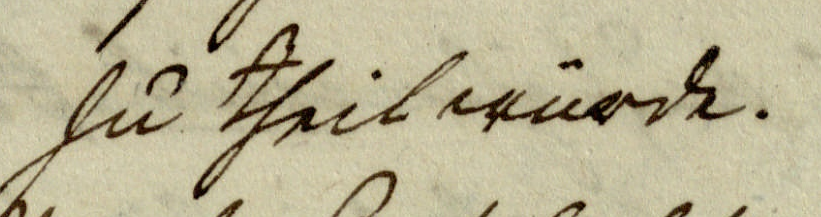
zu Theil würde.
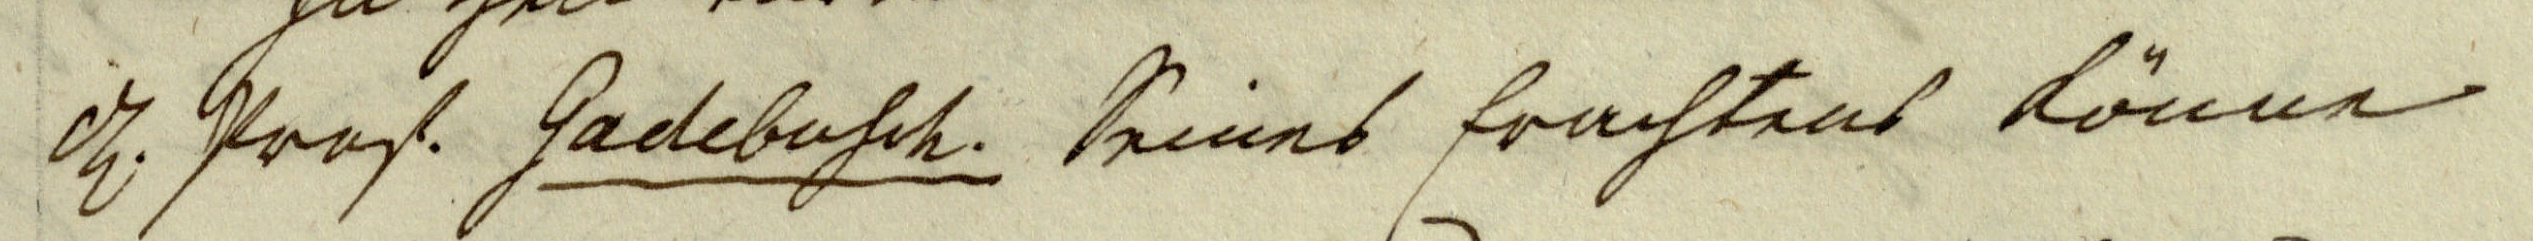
dh. Prof. Gadebusch. Seines Erachtens könne
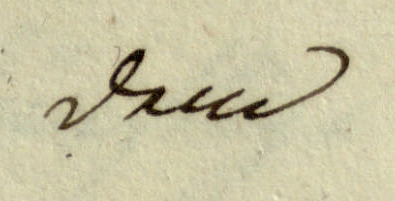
dem
